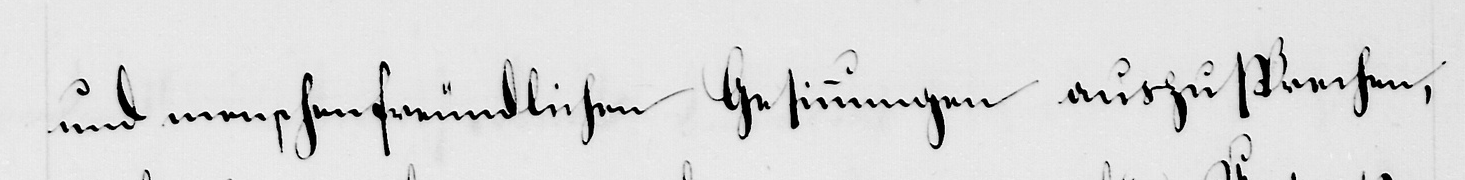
und menschenfreundlichen Gesinnungen auszusprechen,
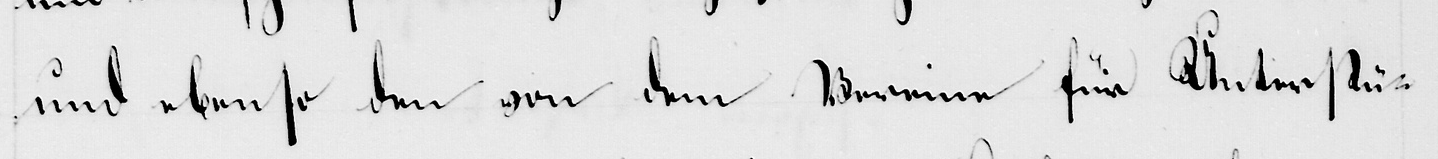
und ebenso den von dem Verein für Unterstü¬
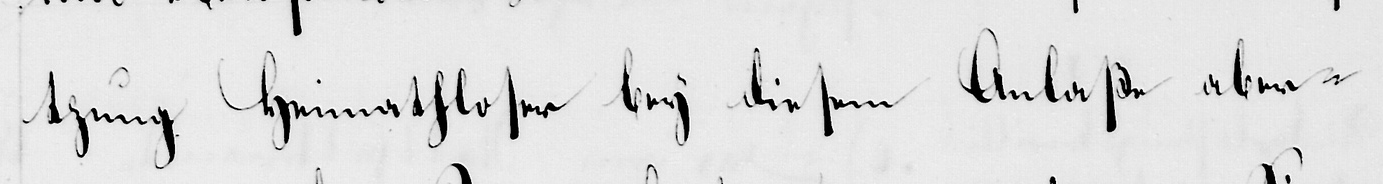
tzung Heimathloser bey diesem Anlaße aber¬
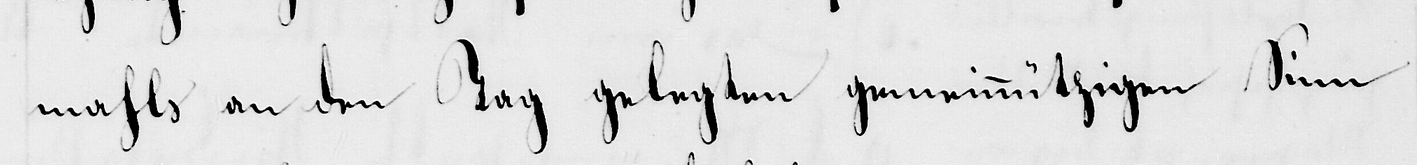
mahls an den Tag gelegten gemeinnützigen Sinn
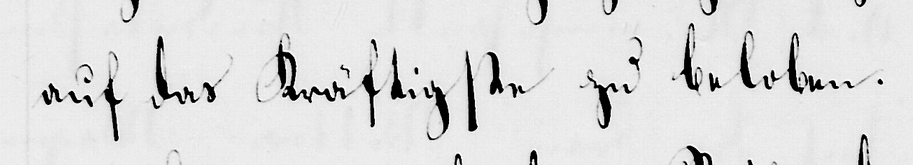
auf das Kräftigste zu beloben.
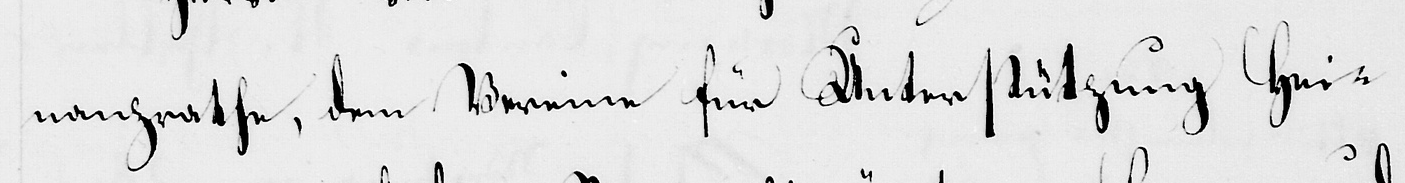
nanzrathe, dem Vereine für Unterstützung Hei¬
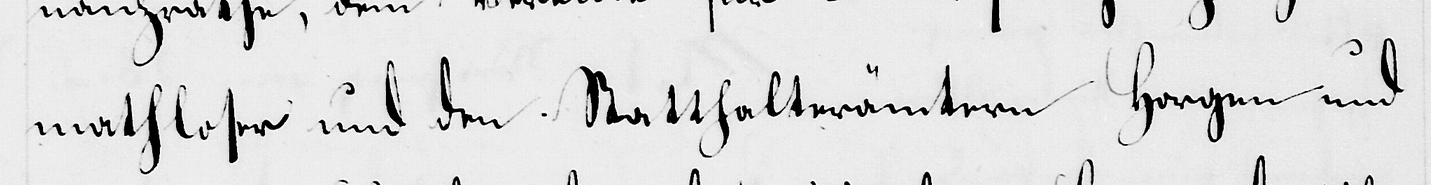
mathloser und den Statthalterämtern Horgen und
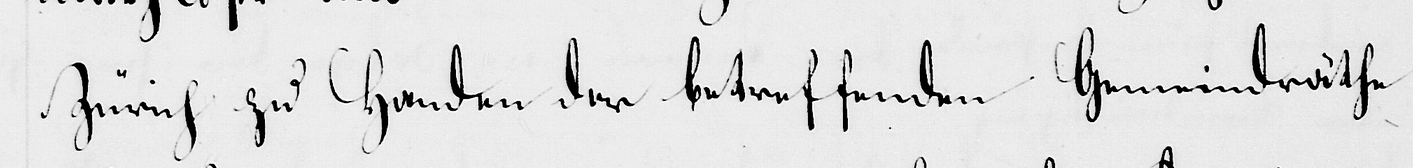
Zürich zu Handen der betreffenden Gemeindräthe
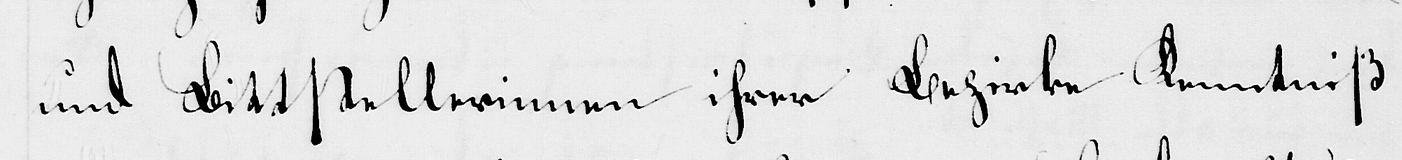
und Bittstellerinnen ihrer Bezirke Kenntniß
